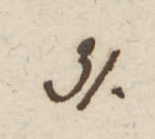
31.
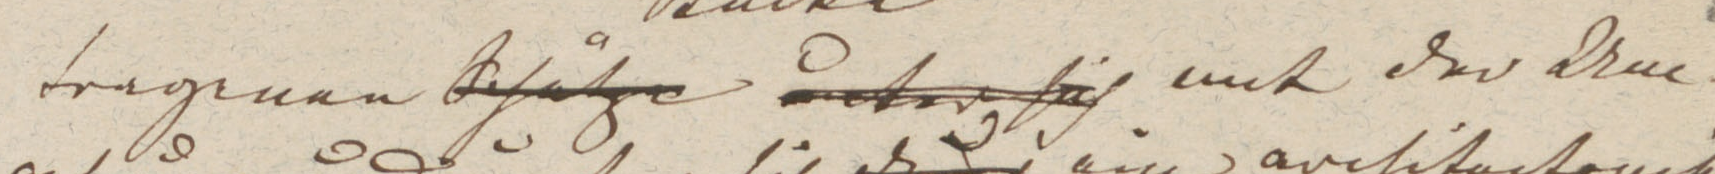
tragenen Schätze Stücke unter sich mit der Um-
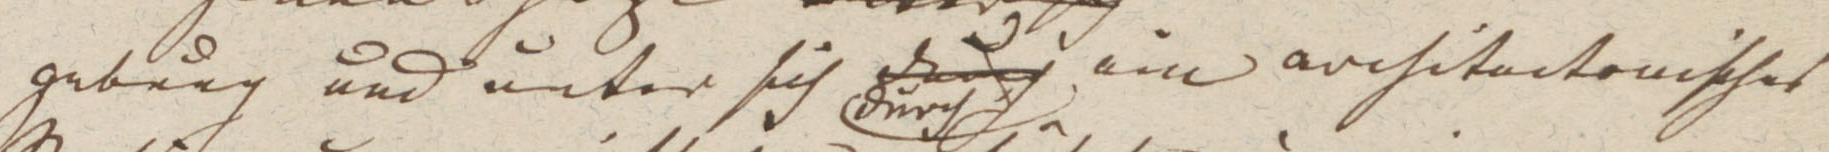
gebung und unter sich durch durch ein architectonisches
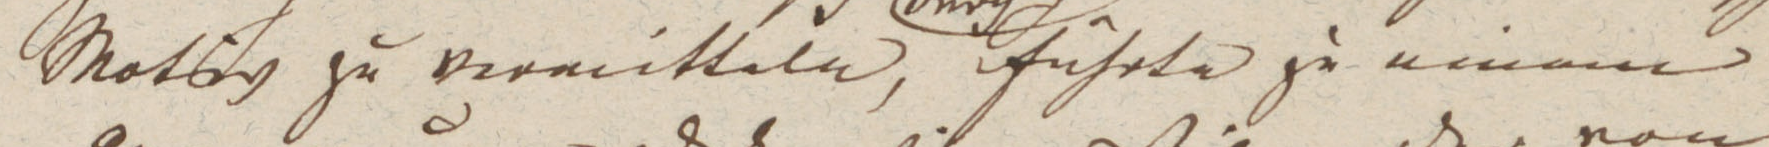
Motiv zu vermitteln, führte zu einem
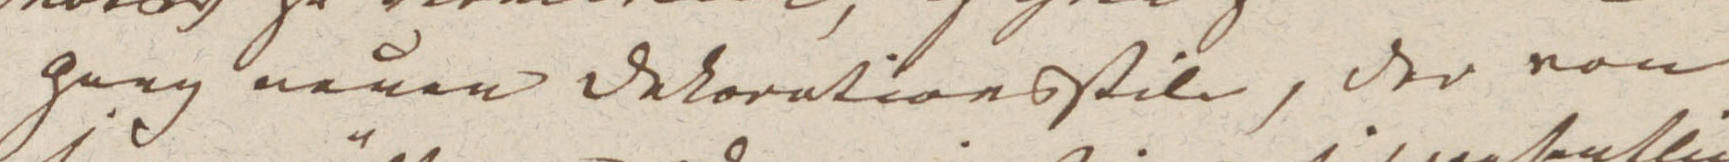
ganz neuen Dekorationsstile, der von
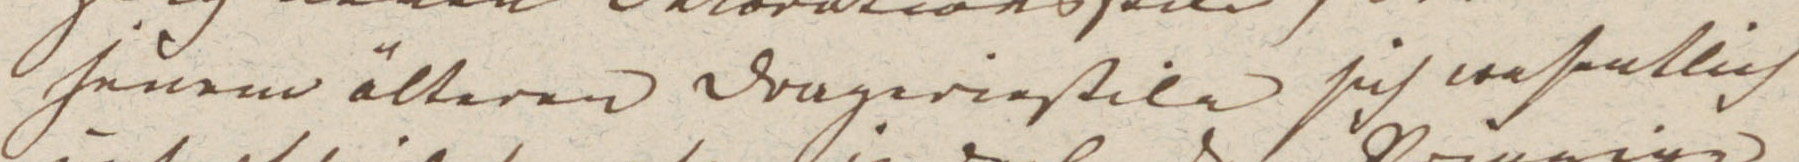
jenem älteren Draperiestile sich wesentlich
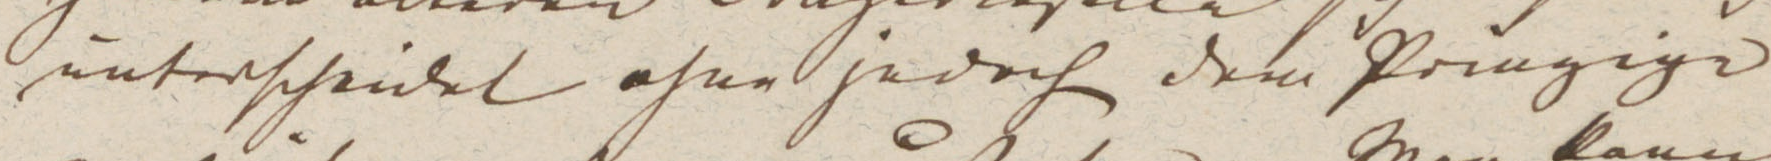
unterscheidet ohne jedoch dem Prinzipe
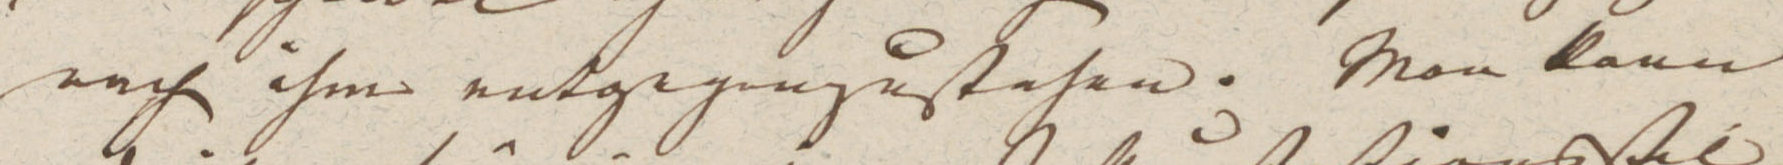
nach ihm entgegenzustehen. Man kann
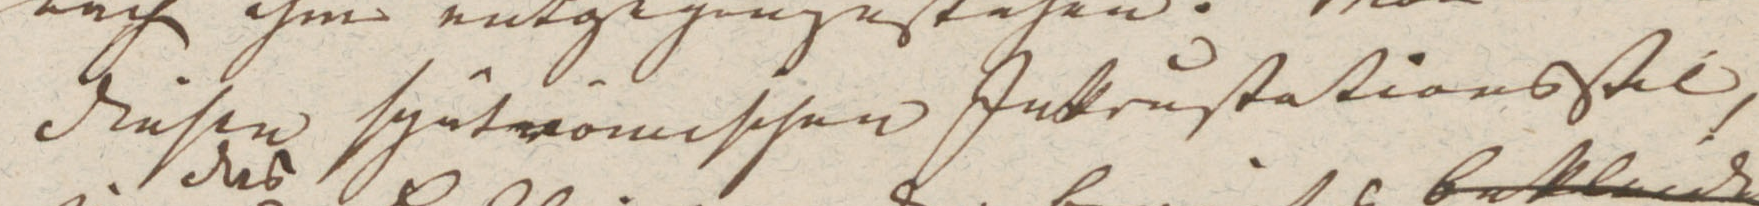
diesen spätömischen Inkrustationsstil,
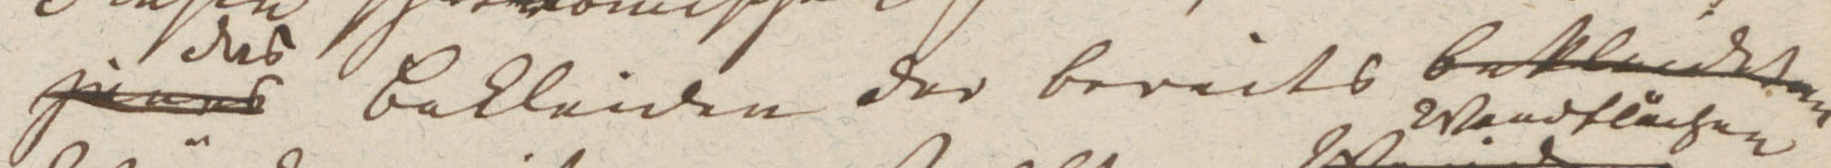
jenes das Bekleiden der bereits bekleideten
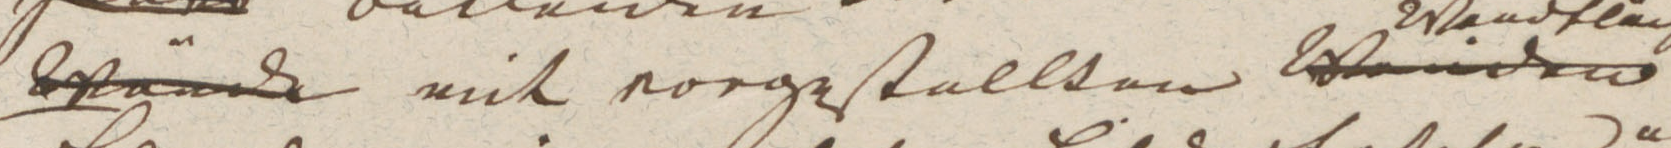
Wände mit vorgestellten Wänden
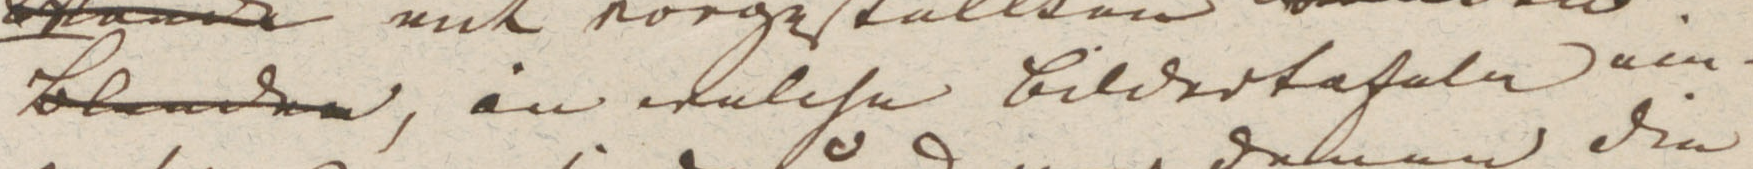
Blenden, ain welche Bildertafeln ein-
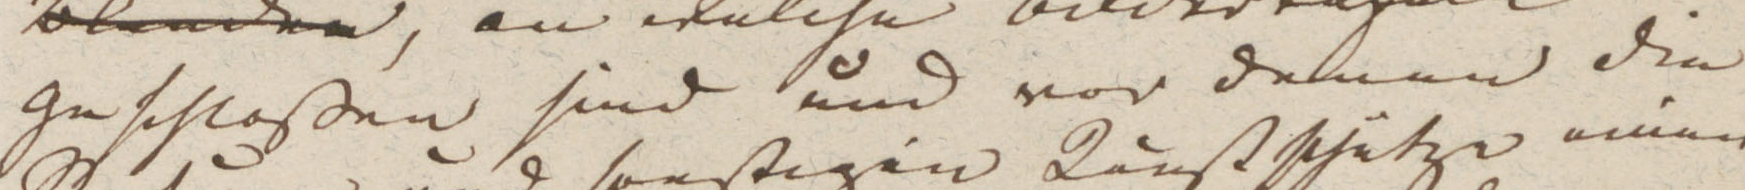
geschlossen sind und vor denen die
